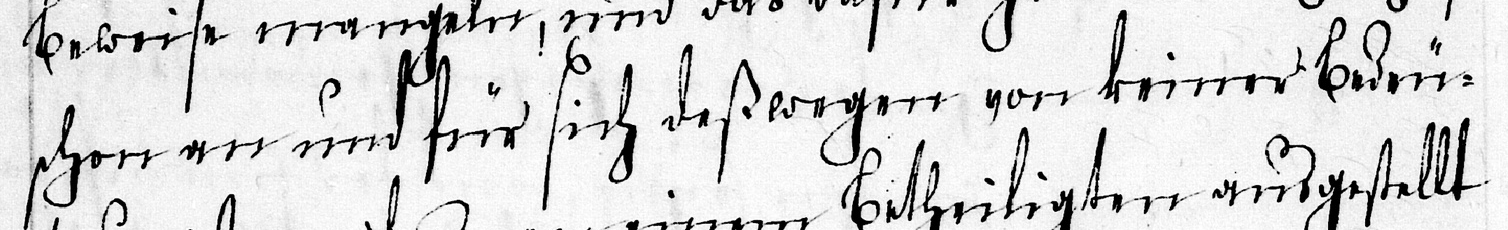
schon an und für sich deßwegen von keiner Bedeu¬
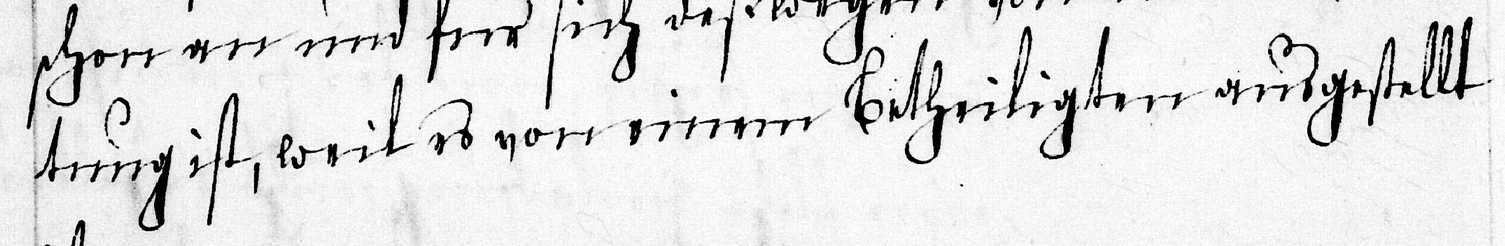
tung ist, weil es von einem Betheiligten ausgestellt
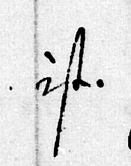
ist.
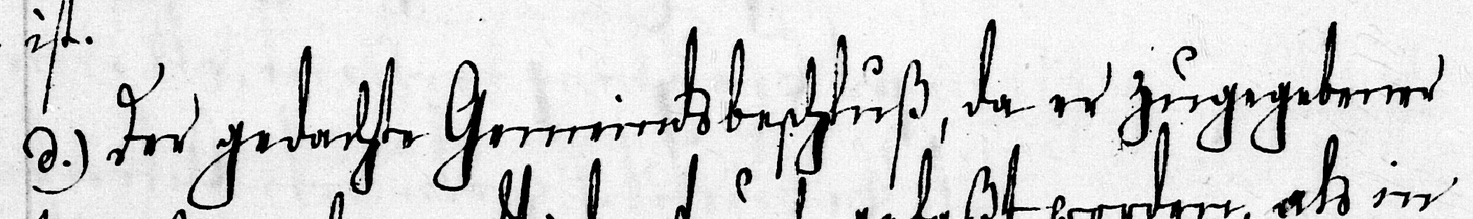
d.) Der gedachte Gemeindsbeschluß, da er zugegebener
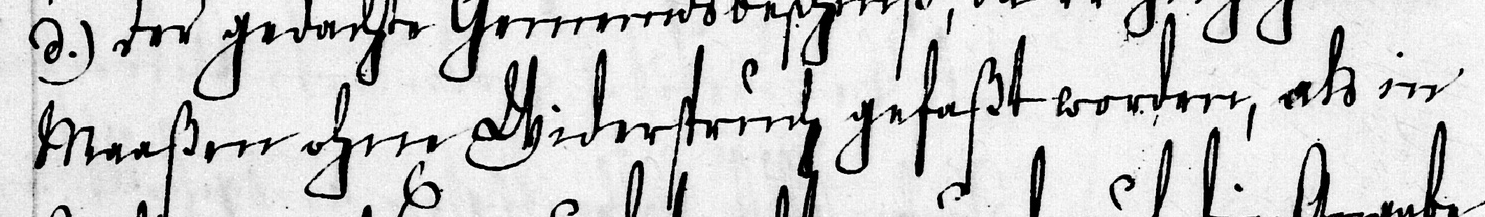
Maaßen ohne Widerspruch gefaßt worden, als in
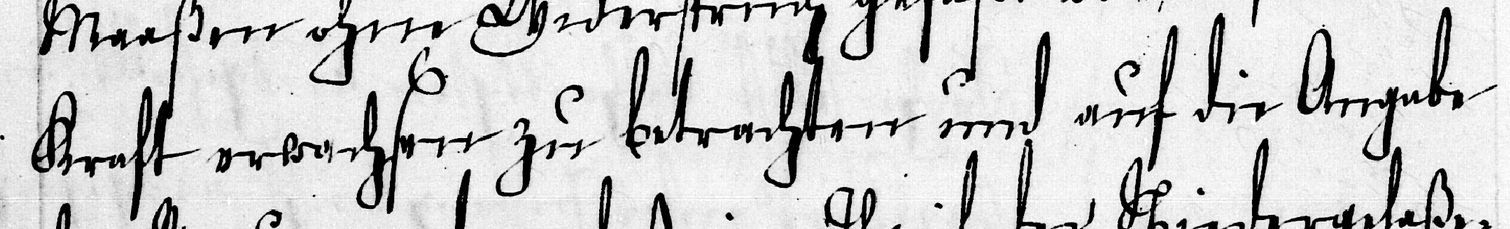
Kraft erwachsen zu betrachten und auf die Angabe
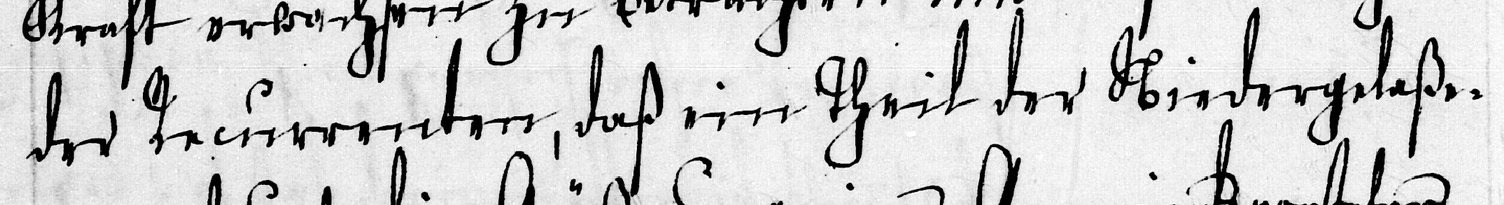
der Recurrenten, daß ein Theil der Niedergelaße¬
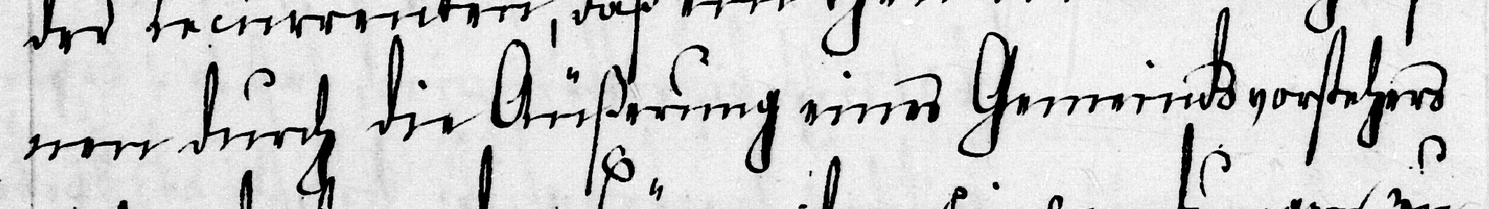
nen durch die Äußerung eines Gemeindsvorstehers
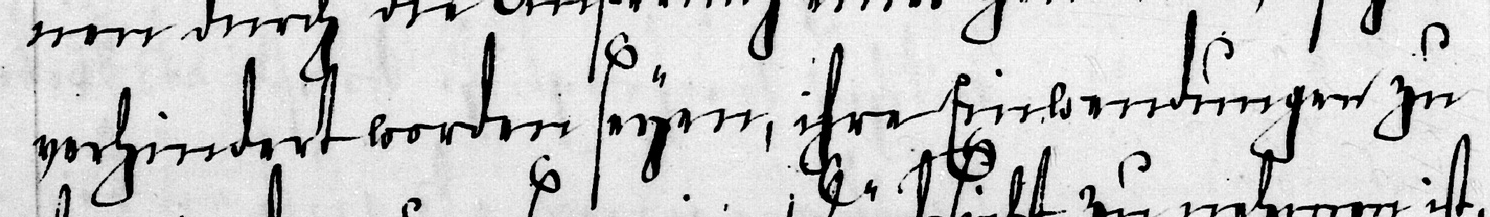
verhindert worden seyen, ihre Einwendungen zu
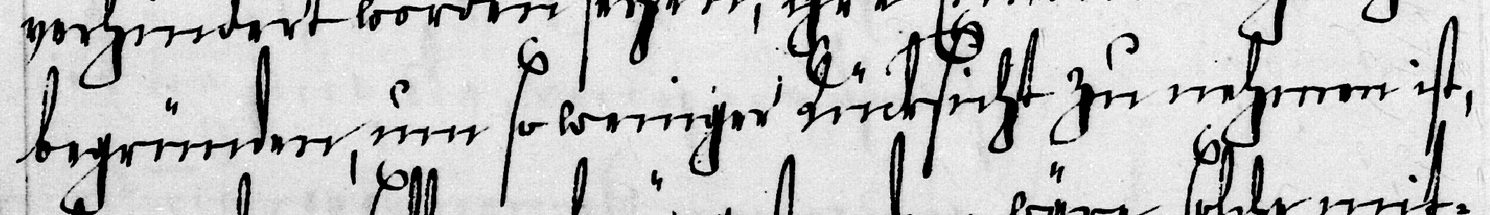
begründen, um so weniger Rücksicht zu nehmen ist,
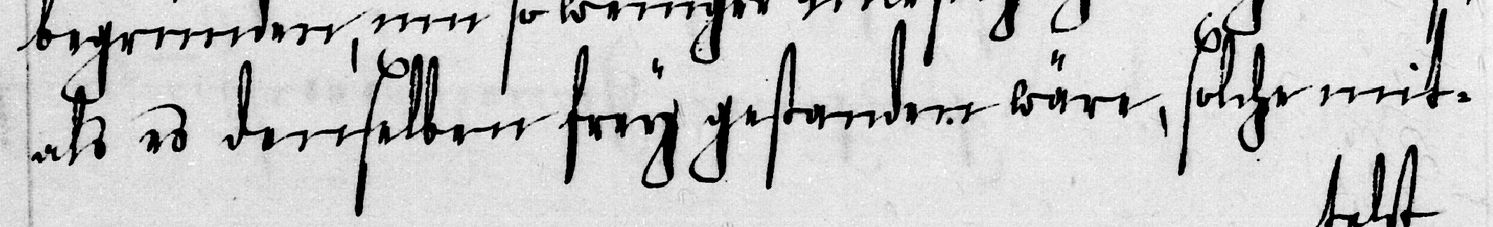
als es denselben frey gestanden wäre, solche mit-
